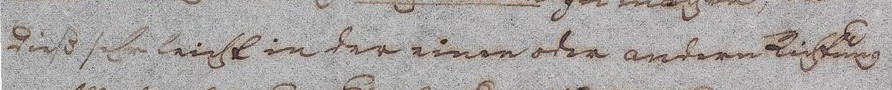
dieß sehr leicht in der einen oder andern Richtung
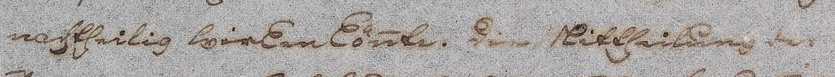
nachtheilig wirken könnte. Die Mittheilung des
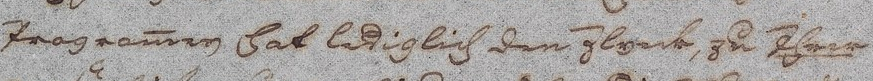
Programmes hat lediglich den Zweck, zu Ihrer
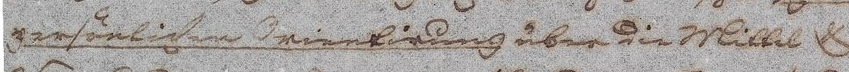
persönlichen Orientirung über die Mittel &
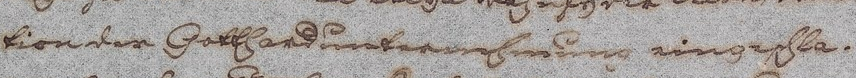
tion der Gotthardbahnunternehmung eingeschla-
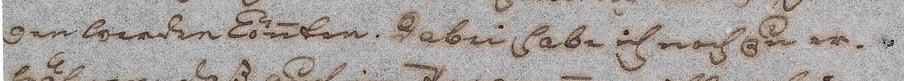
gen werden könnten. Dabei habe ich noch zu er-
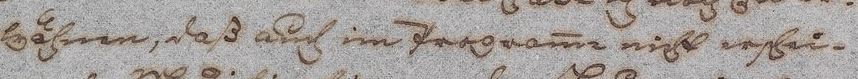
wähnen, daß auch im Programme nicht erschei-
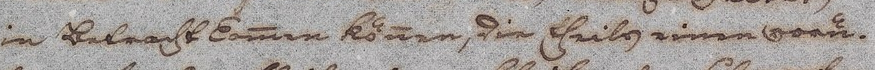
in Betracht kommen können, die theils einen vorü-
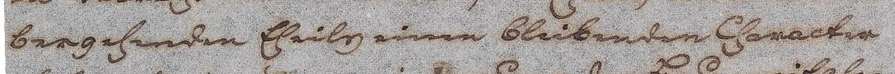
bergehenden theils einen bleibenden Character
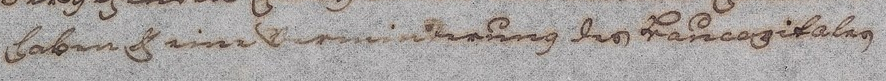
haben & eine Verminderung des Baucapitales
